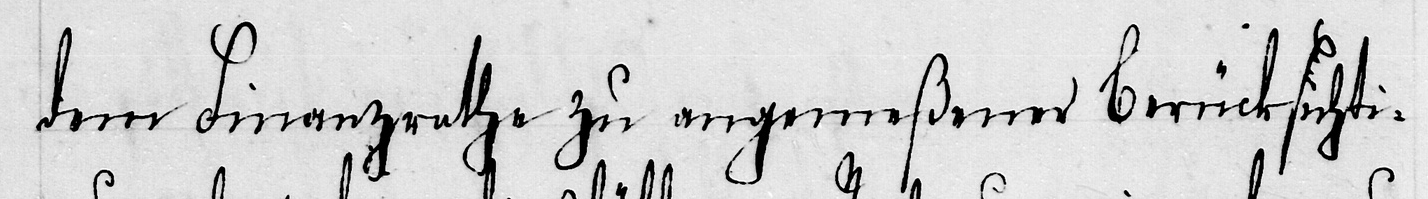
dem Finanzrathe zu angemeßener Berücksichti¬
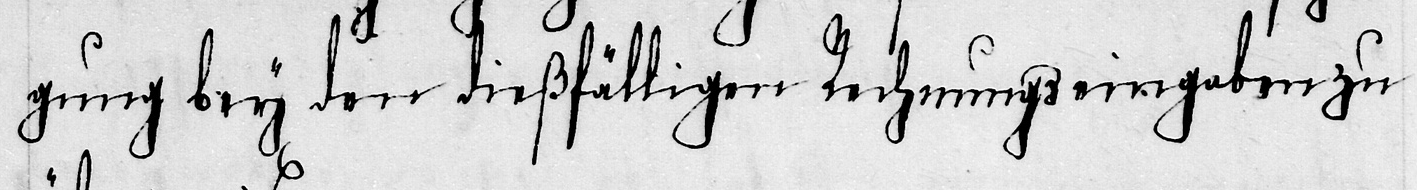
gung bey den dießfälligen Rechnungseingaben zu
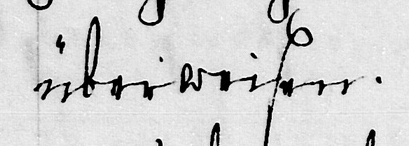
überweisen.
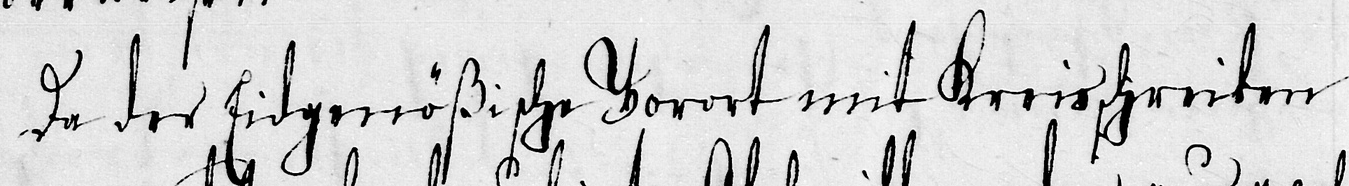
Da der Eidgenößische Vorort mit Kreisschreiben
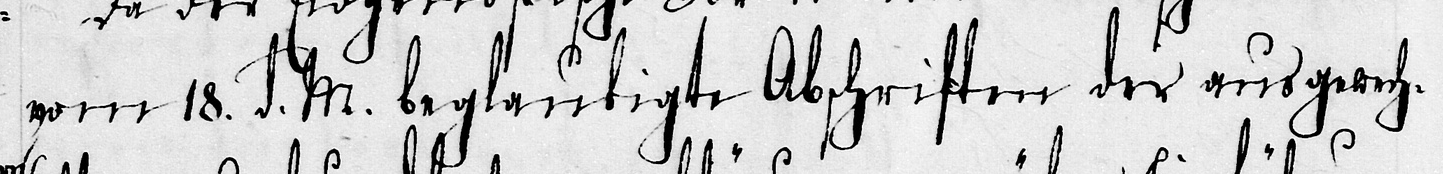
vom 18. d. M. beglaubigte Abschriften der ausgewec¬
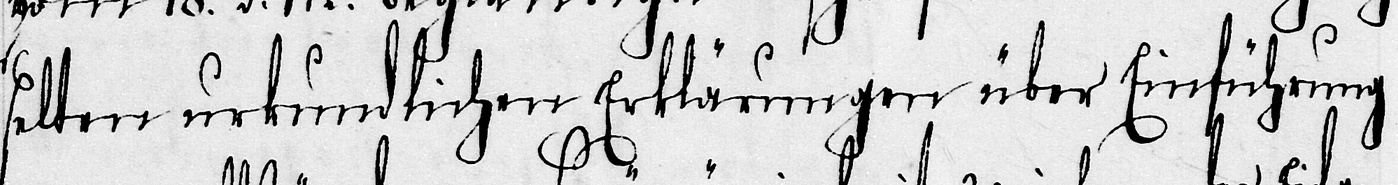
elten urkundlichen Erklärungen über Einführung
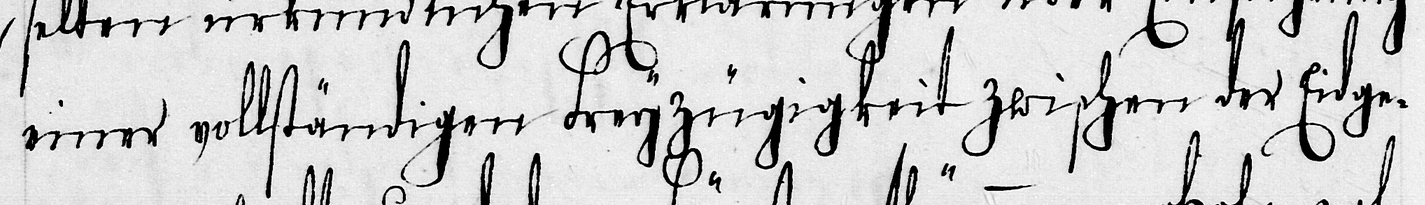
einer vollständigen Freyzügigkeit zwischen der Eidge¬
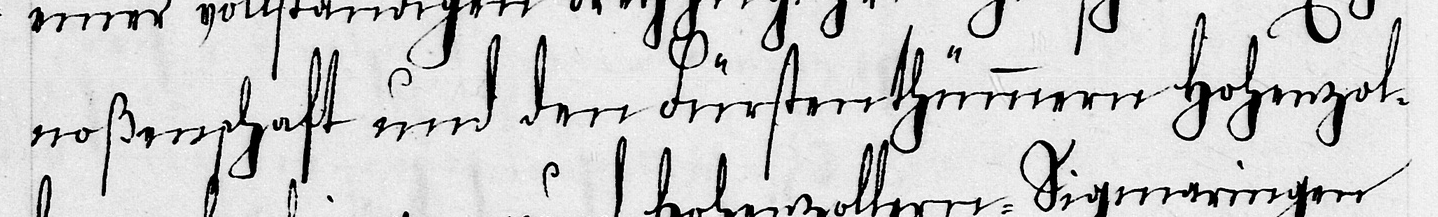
noßenschaft und den Fürstenthümmern Hohenzol¬
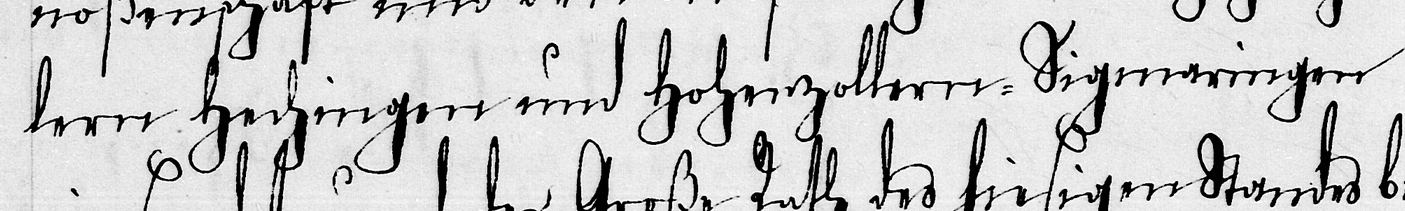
lern Hechingen und Hohenzollern-Sigmaringen
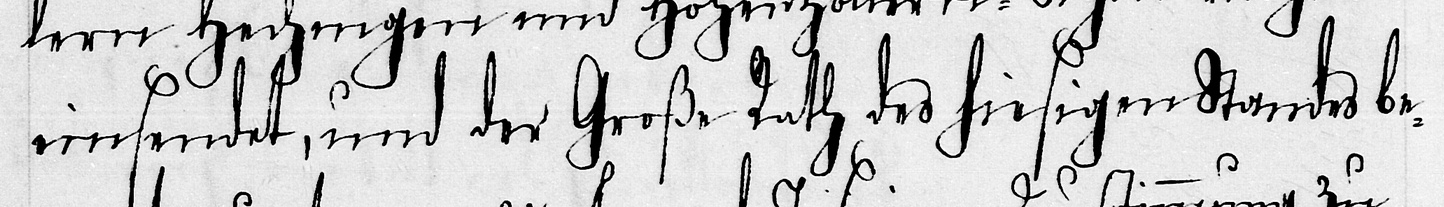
einsendet, und der Große Rath des hiesigen Standes be¬
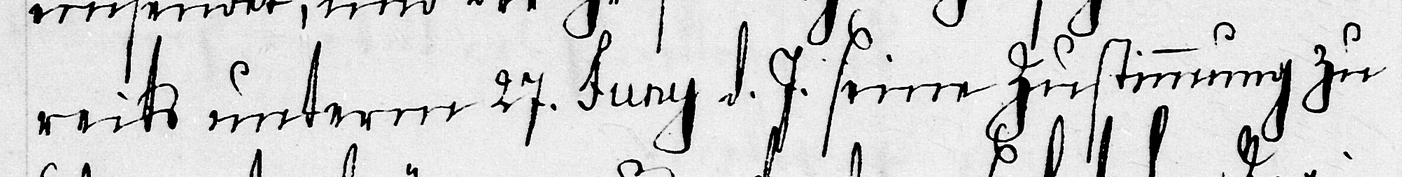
reits unterm 27. Juny d. J. seine Zustimmung zu
